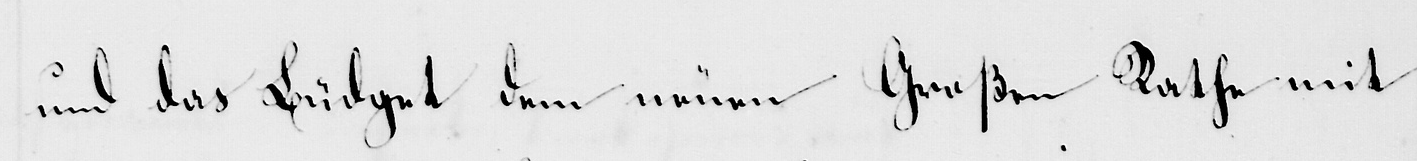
und das Budget dem neuen Großen Rathe mit
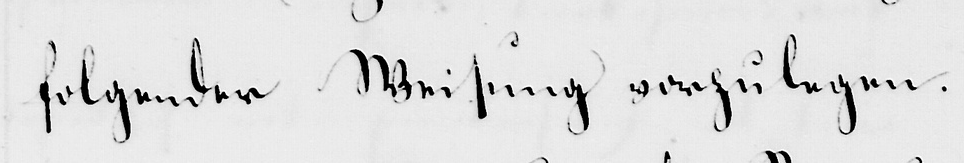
folgender Weisung vorzulegen.
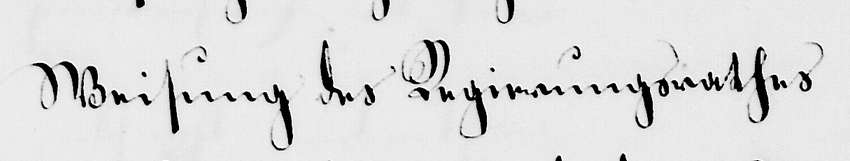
Weisung des Regierungsrathes
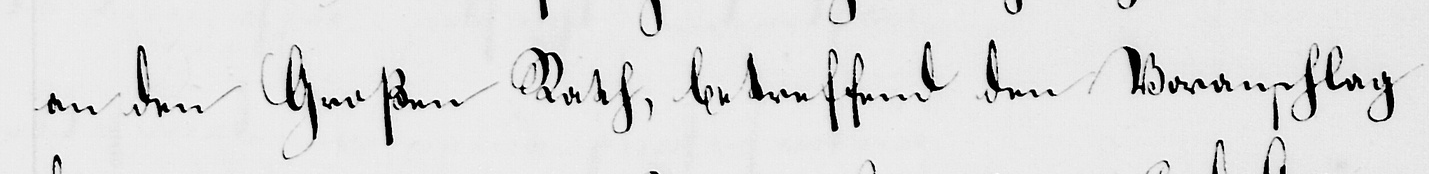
an den Großen Rath, betreffend den Voranschlag
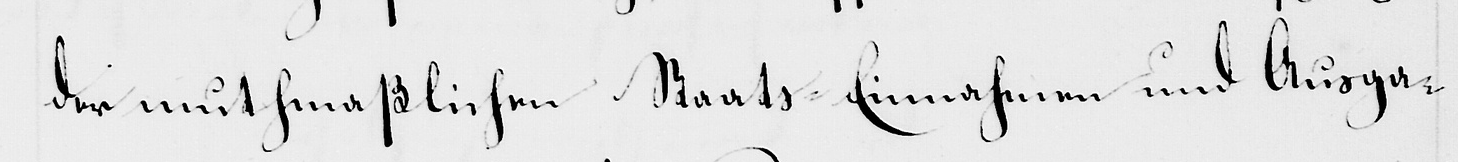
der muthmaßlichen Staats-Einnahmen und Ausga¬
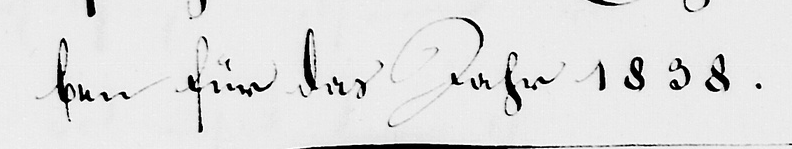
ben für das Jahr 1838.
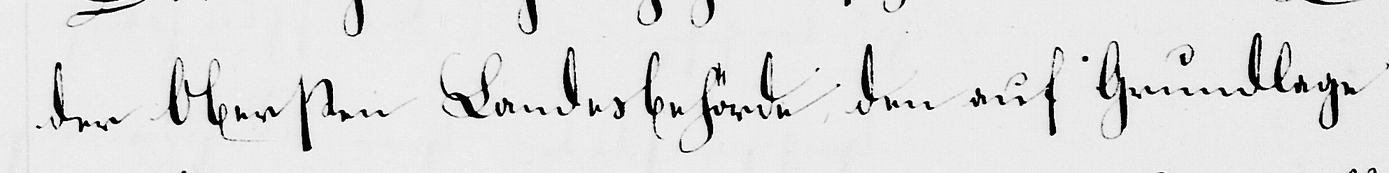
der Obersten Landesbehörde den auf Grundlage
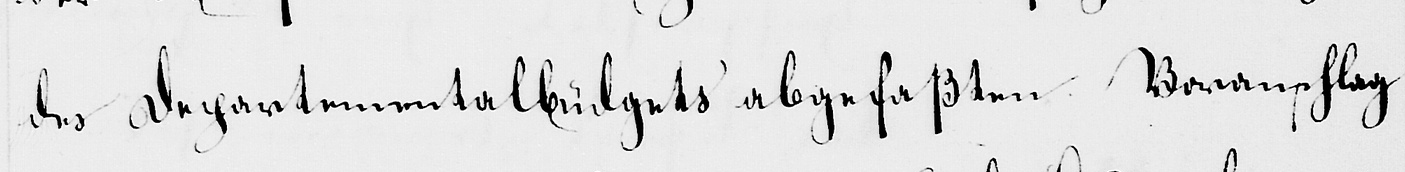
des Departementalbudgets abgefaßten Voranschlag
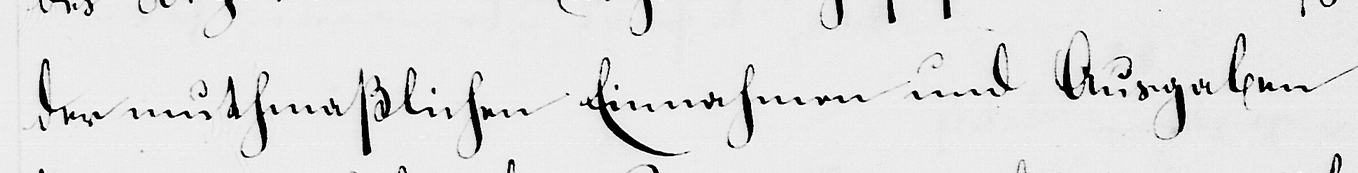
der muthmaßlichen Einnahmen und Ausgaben
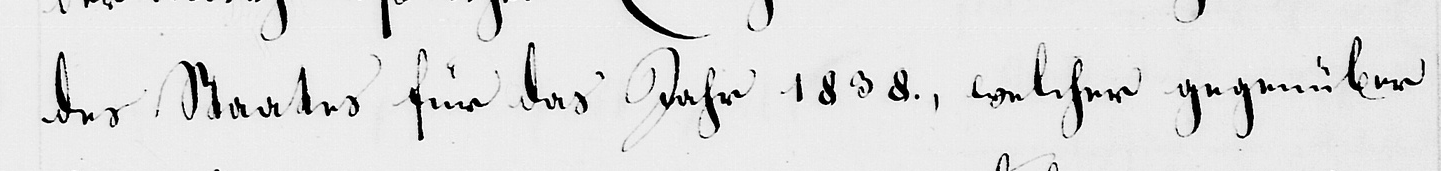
des Staates für das Jahr 1838., welcher gegenüber
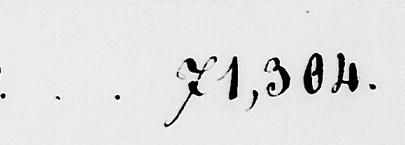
71,304.
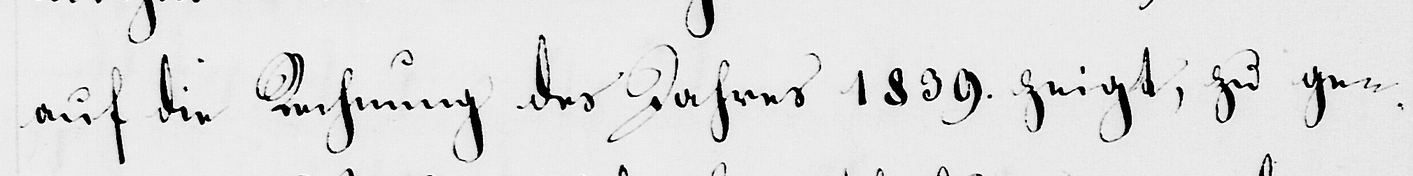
auf die Rechnung des Jahres 1839 zeigt, zu ge¬
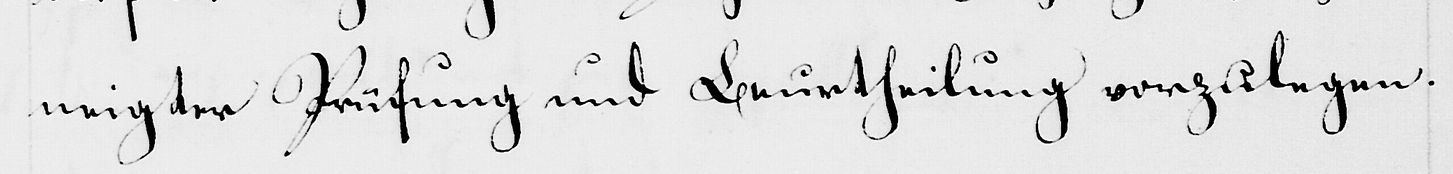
neigter Prüfung und Beurtheilung vorzulegen.
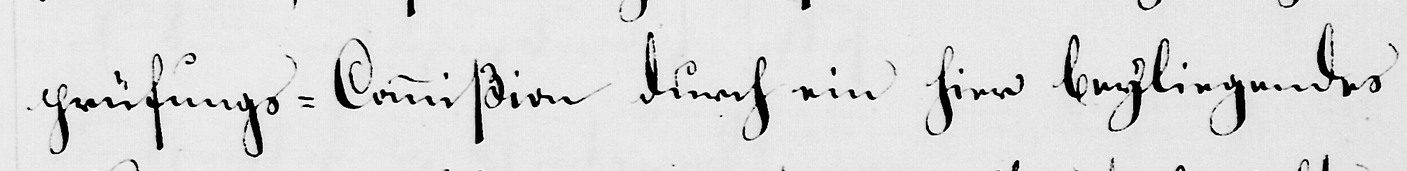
rüfungs-Commißion durch ein hier beyliegendes
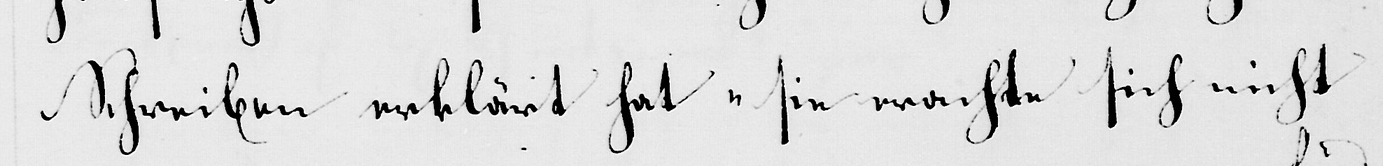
Schreiben erklärt hat „sie erachte sich nicht
